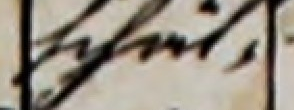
eschät„
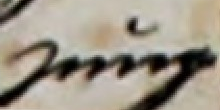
zung
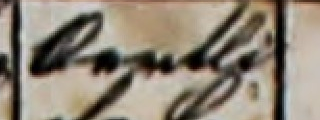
Oertli„
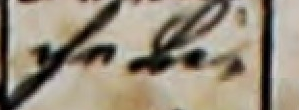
che
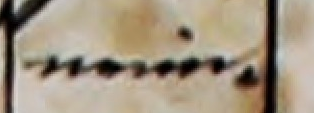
Ben???„
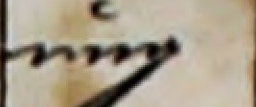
ung
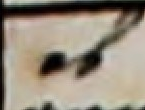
ob
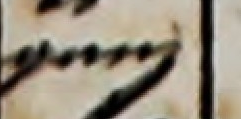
ganz
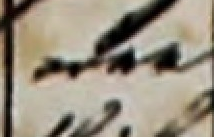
wer
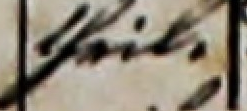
theil.
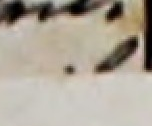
weise
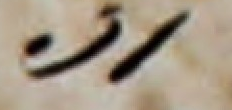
51
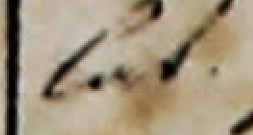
Cat.
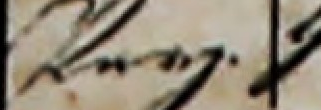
Perg.
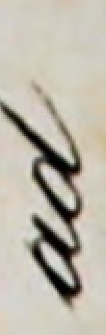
ad
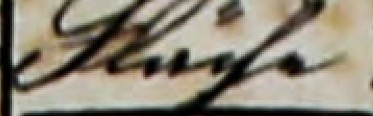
Fläche
